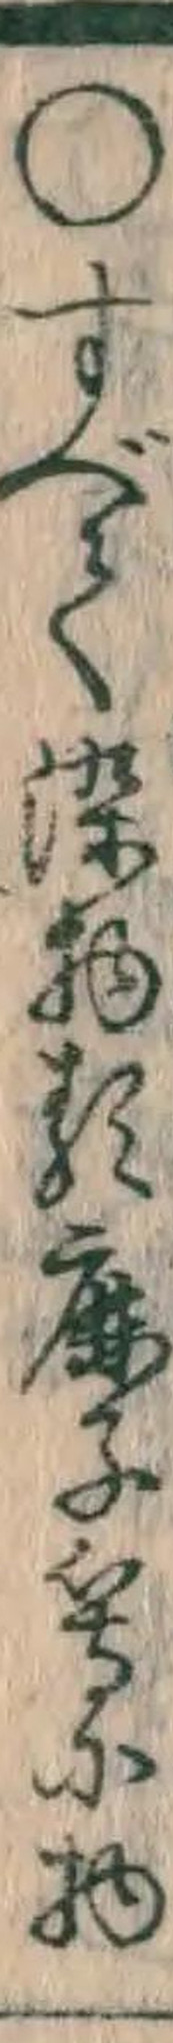○すべて染物類鹿子等に物
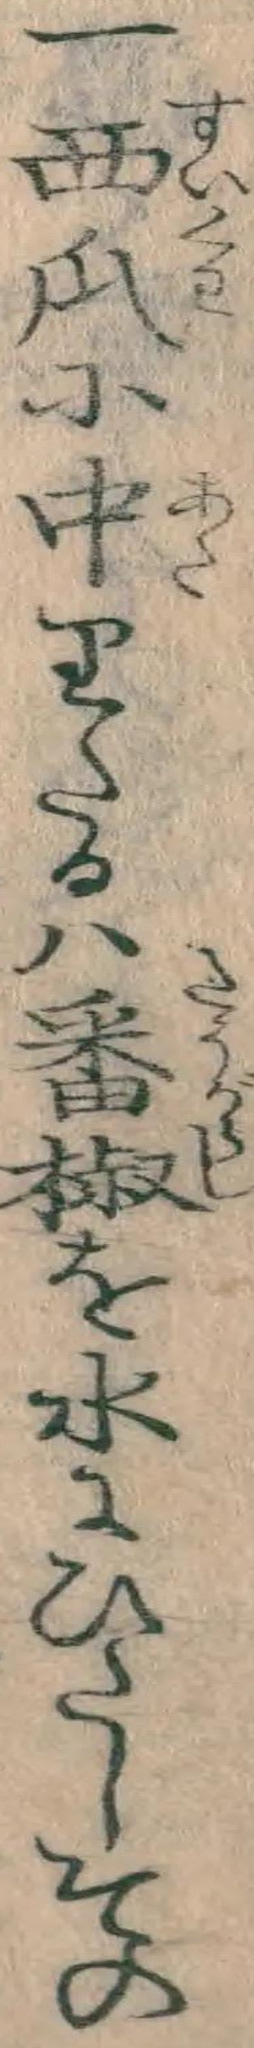一西瓜に中りたるは番椒を水にひたしてその
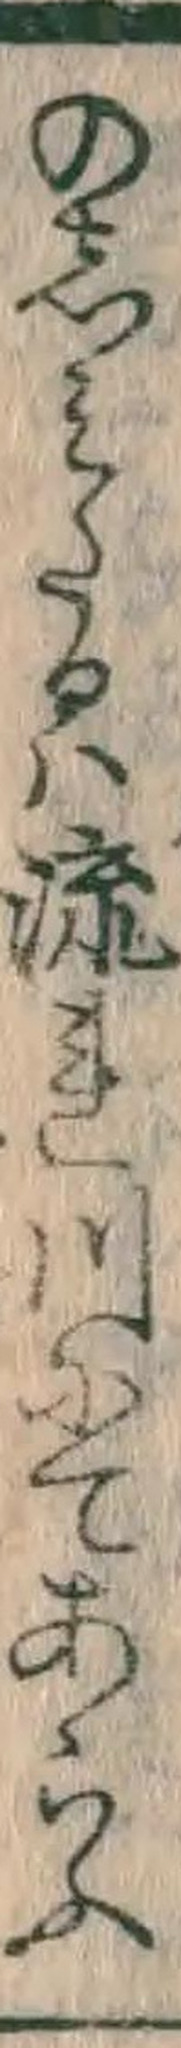のしみたるは流れ川にてあらふ
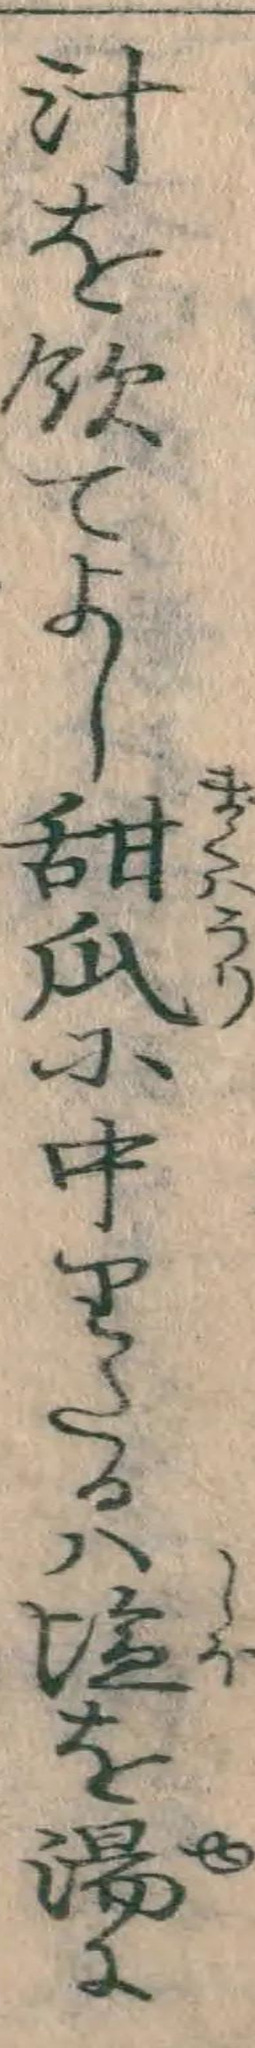汁を飲てよし甜瓜に中りたるは塩を湯に
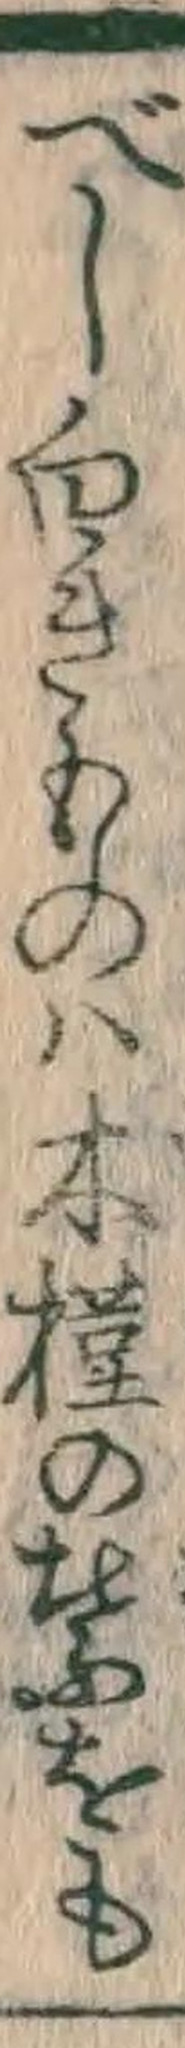べし白きものは木槿の葉をも
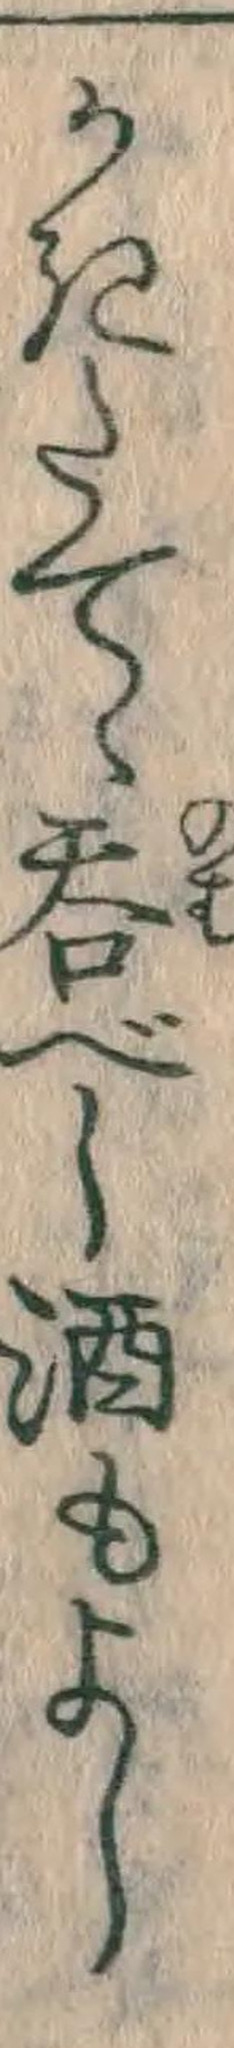かきたてゝ吞べし酒もよし
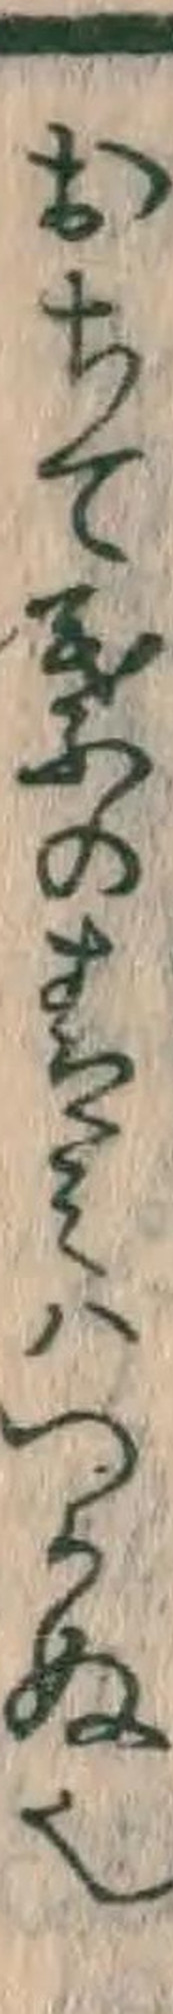おちて葉の青みはつかぬ也
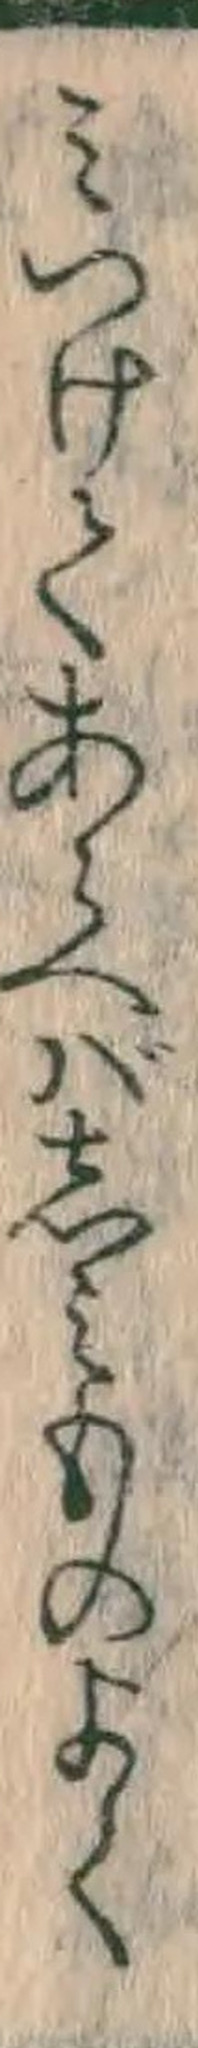みつけてあらへばしみものよく
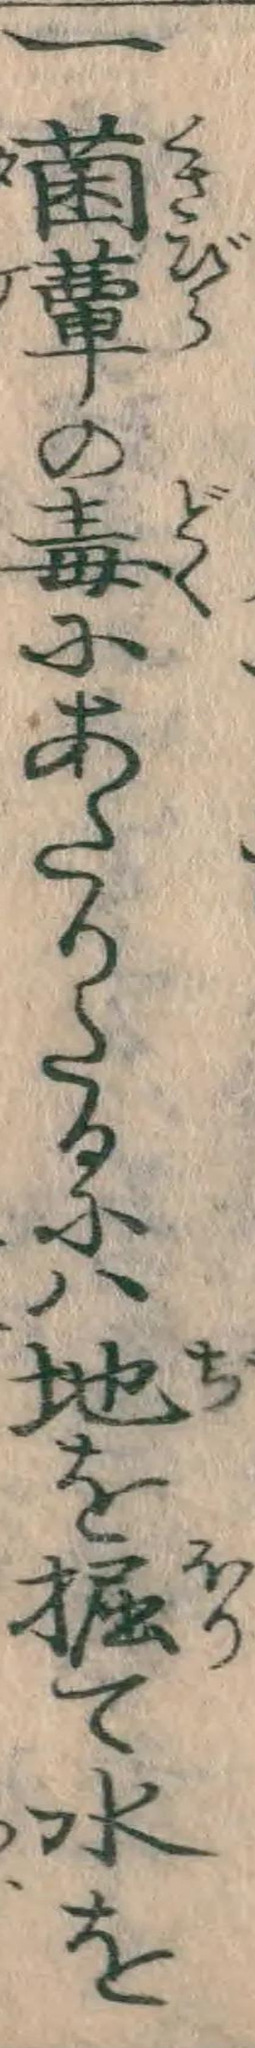一菌蕈の毒にあたりたるには地を掘て水を
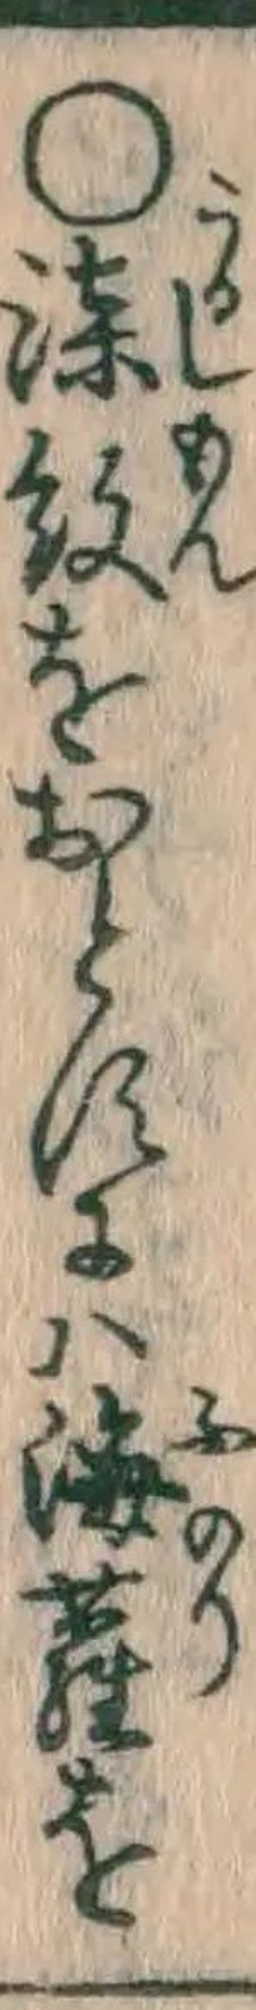○漆紋をおとすには海蘿を
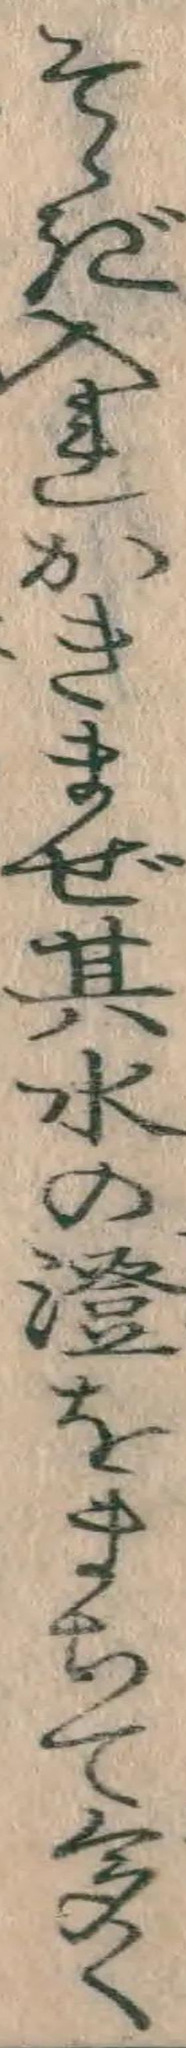そゝぎ入れかきまぜ其水の澄をまちて多く
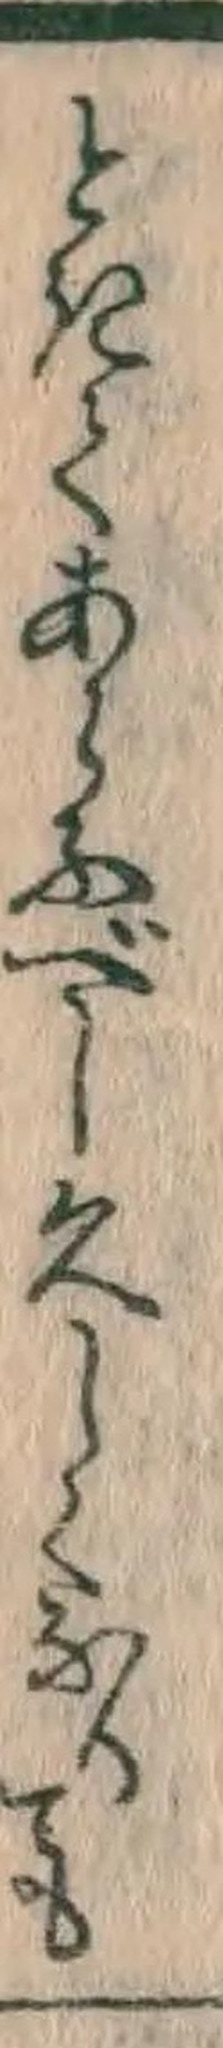ときてあらふべし久しくふりても
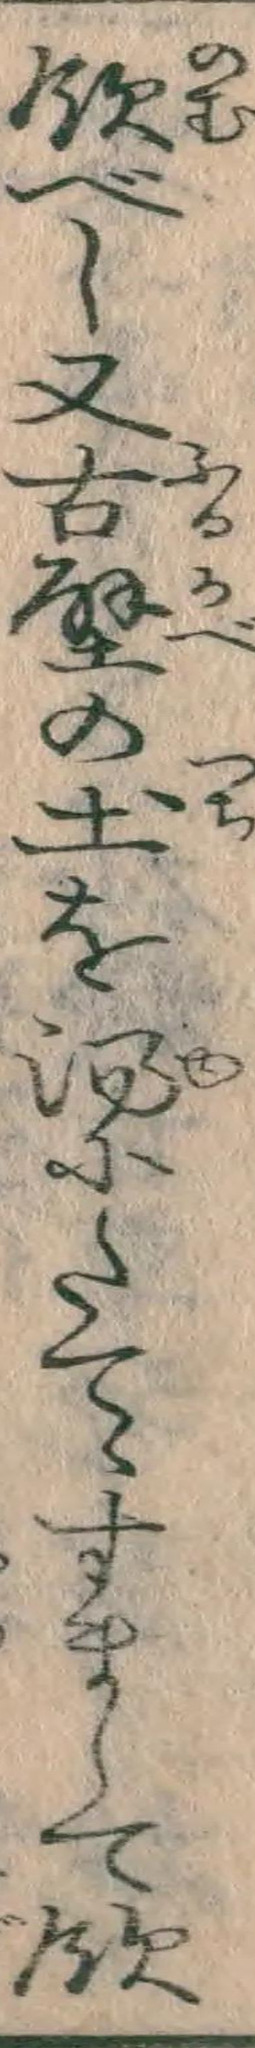飲べし又古壁の土を湯にたてゝすまして飲
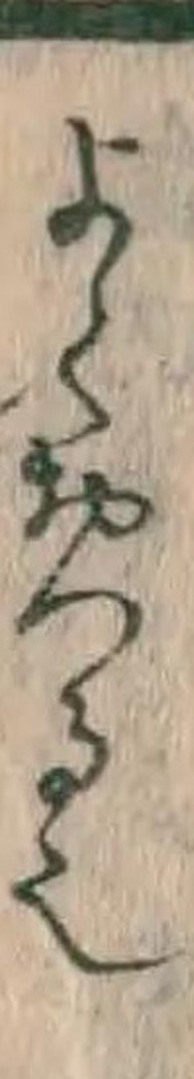よくおつる也
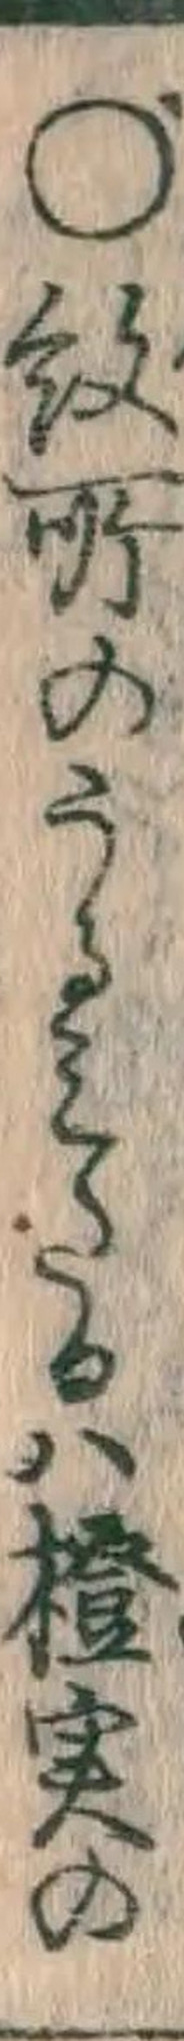○紋所のうるみたるは橙実の
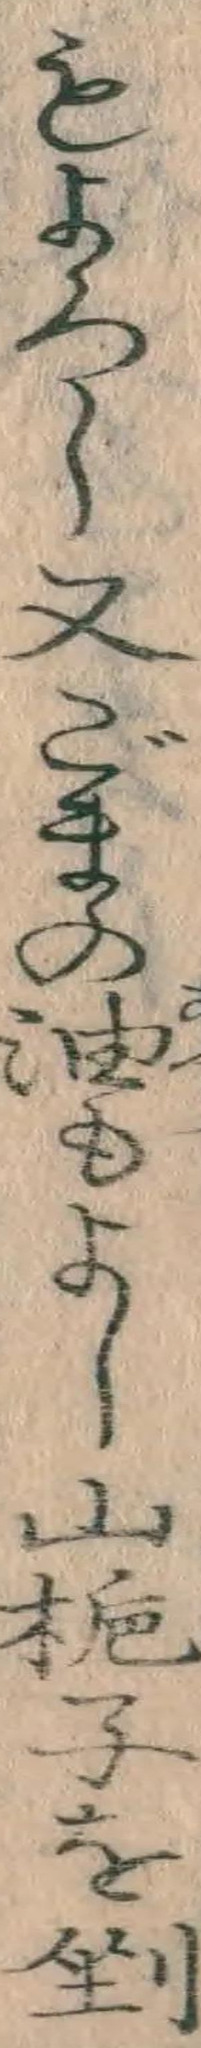もよろし又ごまの油もよし山梔子を剉
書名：広益秘事大全 3巻. [3]
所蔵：国立国会図書館 National Diet Library, JAPAN
